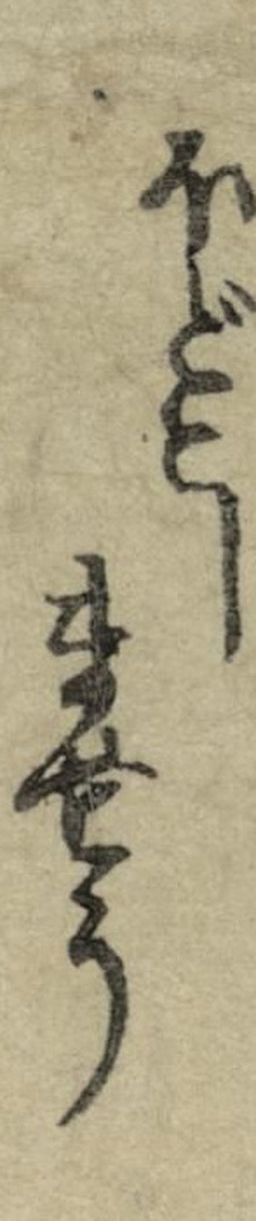ませう
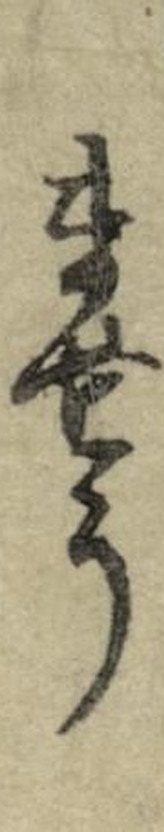ませう
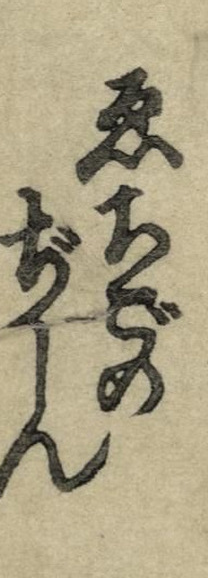えちごの
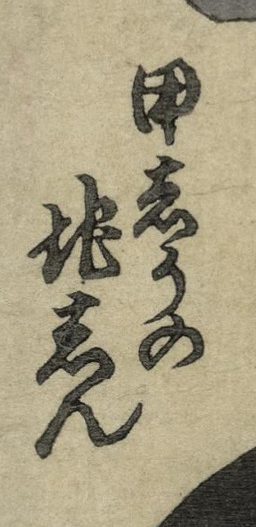地しん
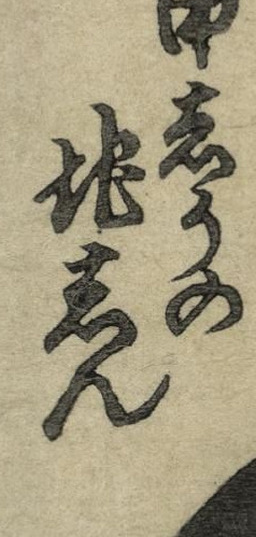ぢしん
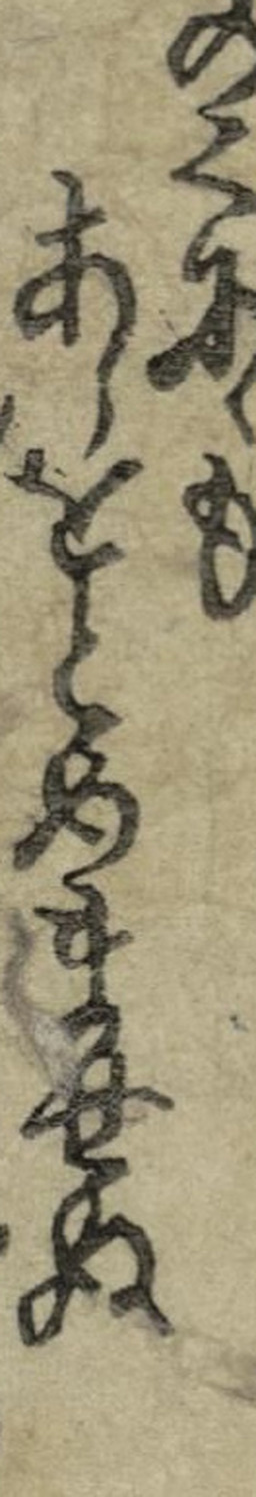あしをとめませぬ
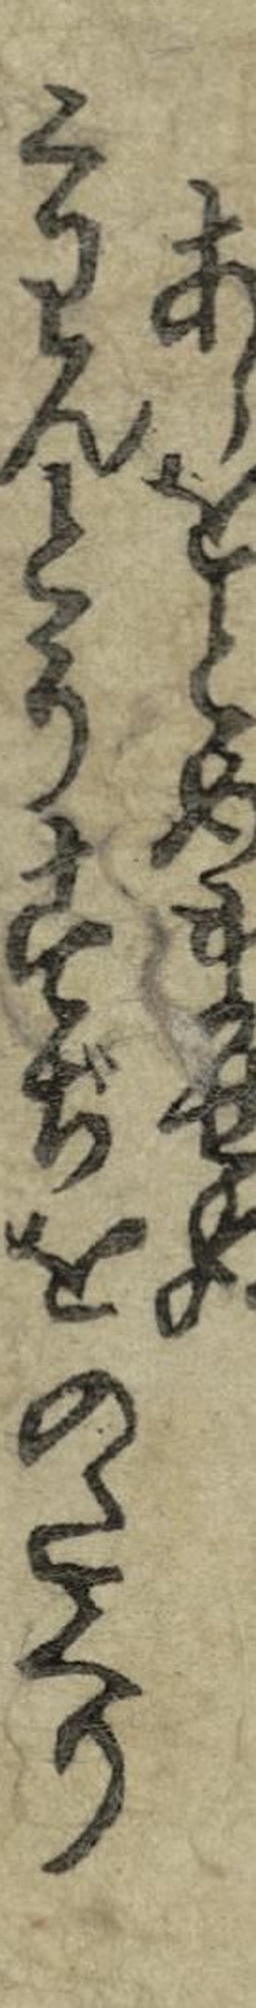くわんとうすじをのたくり
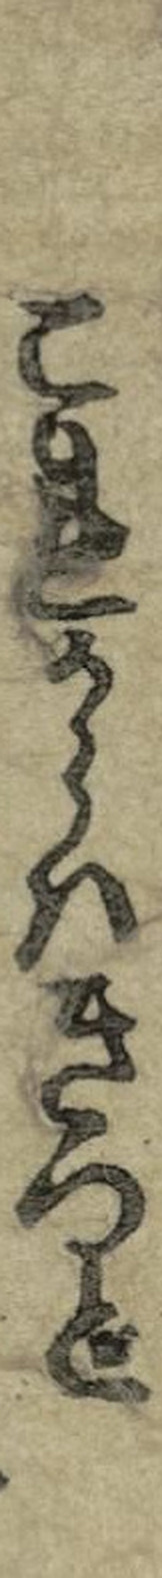これからはきつと
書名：自身除妙法
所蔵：東京大学地震研究所図書室 Earthquake Research Institute Library, The University of Tokyo, JAPAN
